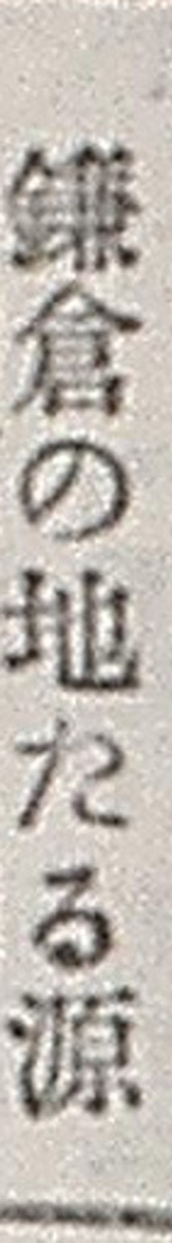鎌倉の地たる源
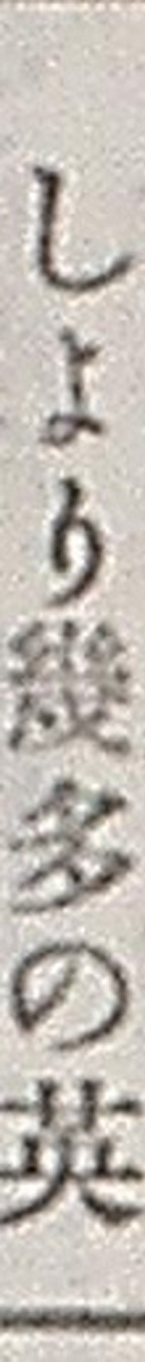しより幾多の英
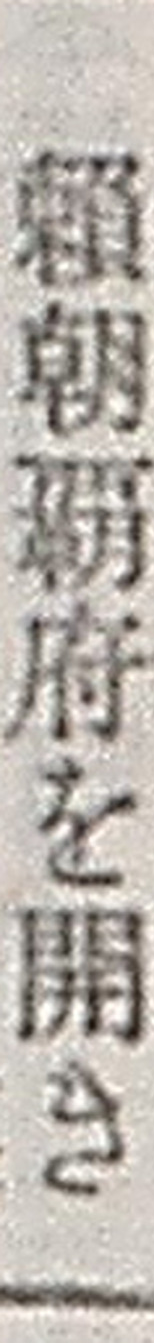頼朝覇府を開き
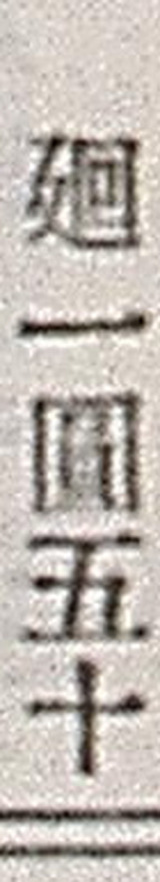廻一円五十
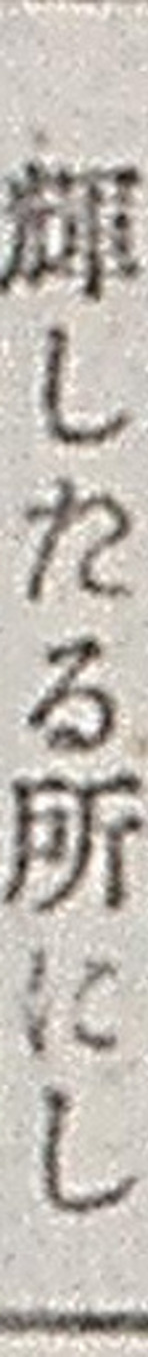輝したる所にし
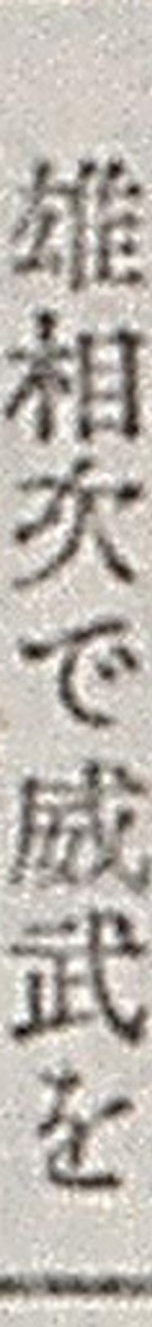雄相次で威武を
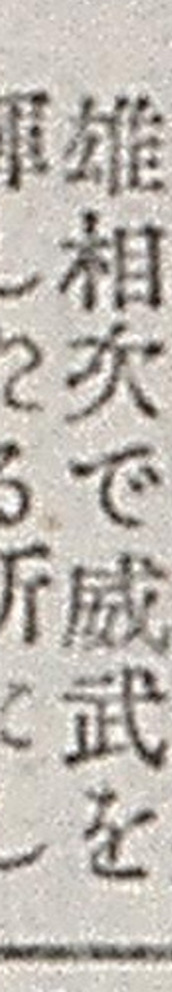雄相次で威武を
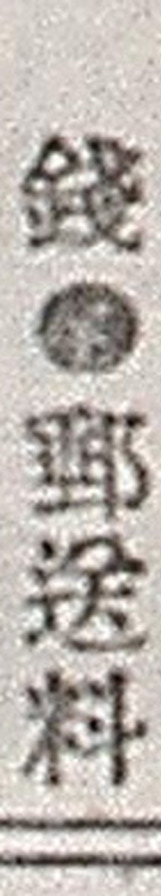銭●郵送料
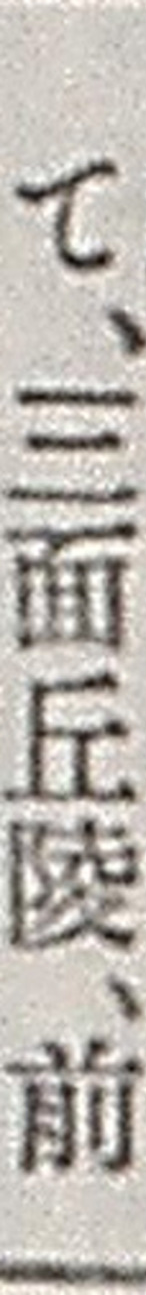て、三面丘陵、前
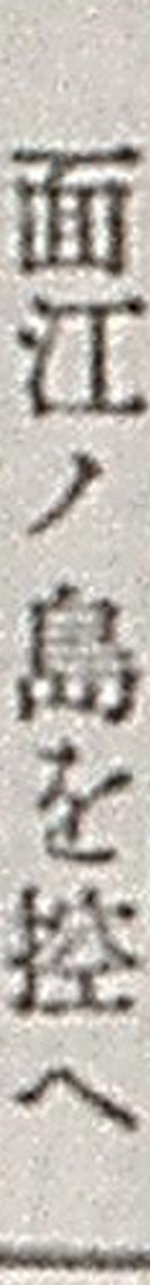面江ノ島を控へ
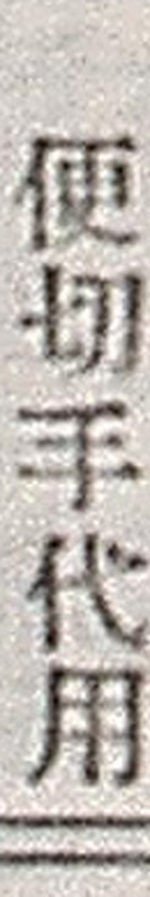便切手代用
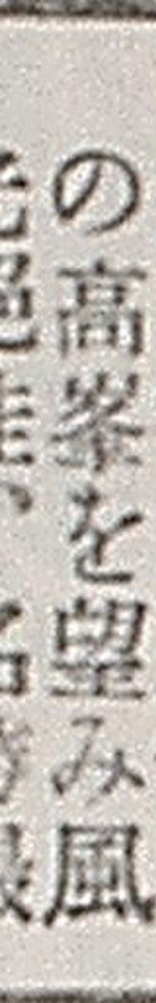の高峯を望み風
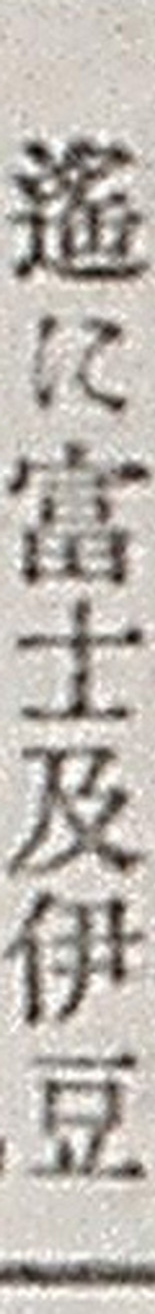遥に富士及伊豆
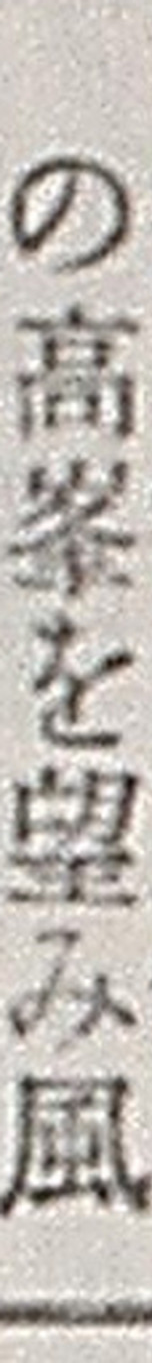の高峯を望み風
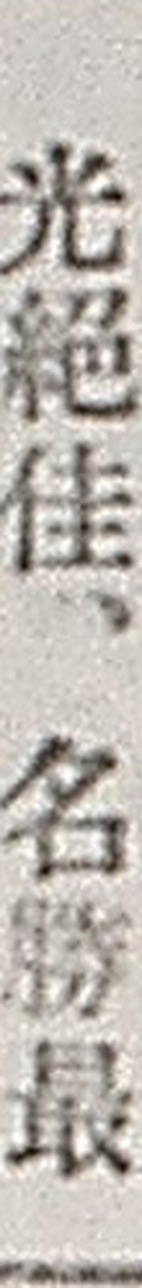光絶佳、名勝最
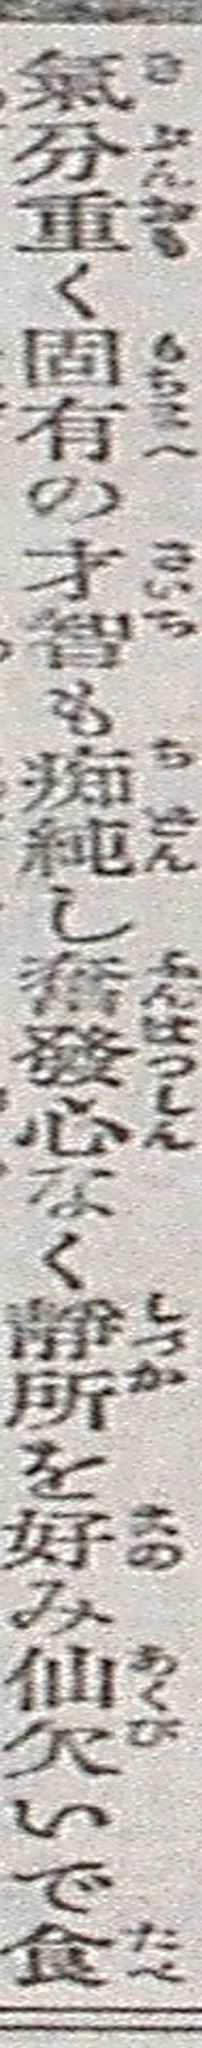気分重く固有の才智も痴純し奮発心なく静所を好み仙欠ひで食
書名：風俗畫報臨時増刊第百二十號　大海嘯被害録（下）
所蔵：東京大学地震研究所図書室 Earthquake Research Institute Library, The University of Tokyo, JAPAN
